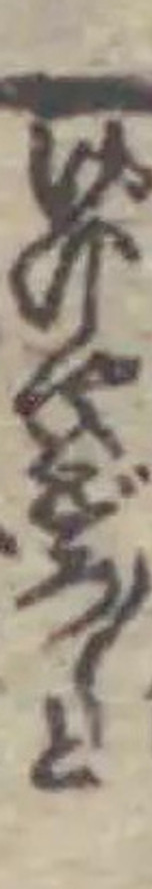けいしやハどろ〳〵と
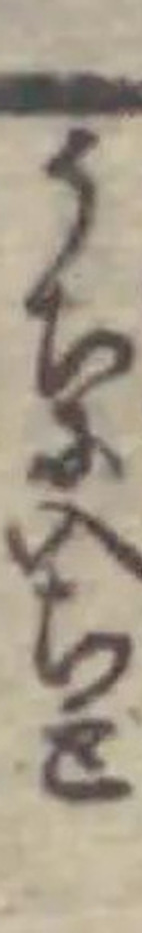うちに入ちと
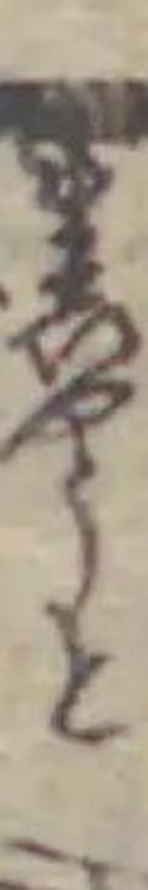ましやうと
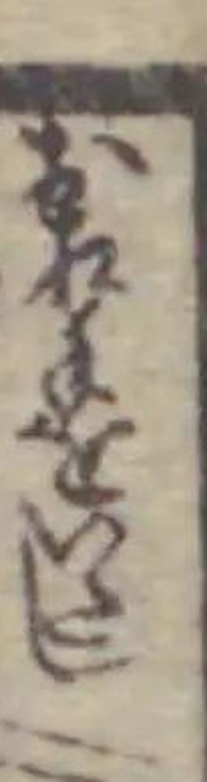お相手をいたし
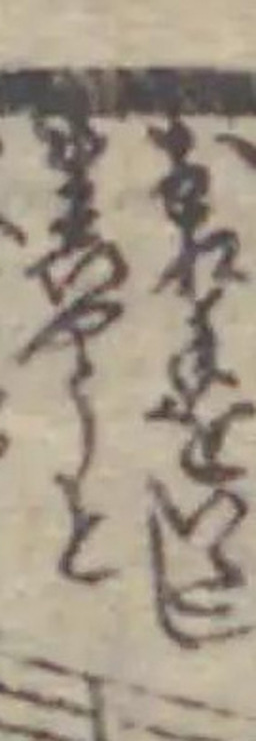ましやうと
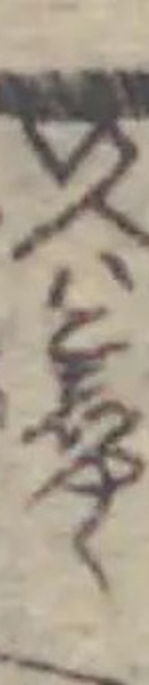いへはこしやく
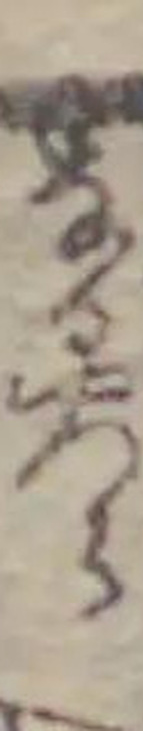なるやつら
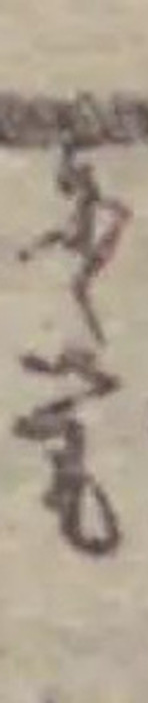にくさも
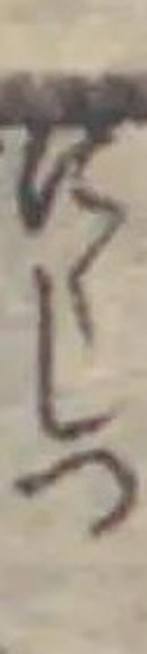にくしつ
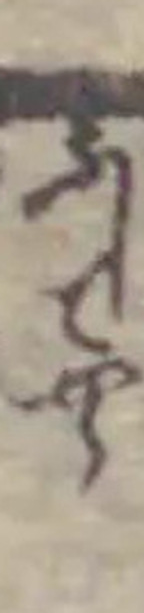ぶしてやら
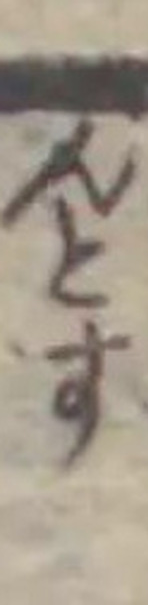んとす
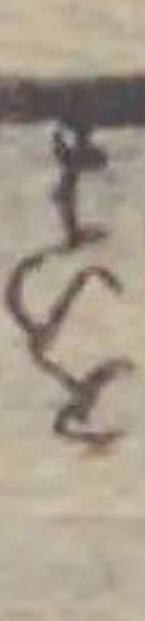はいを
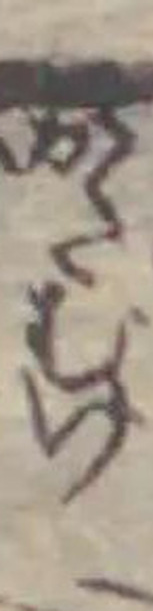かたむけ
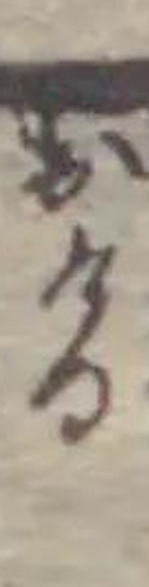おける
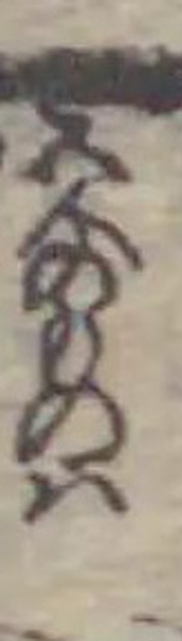五人のものは
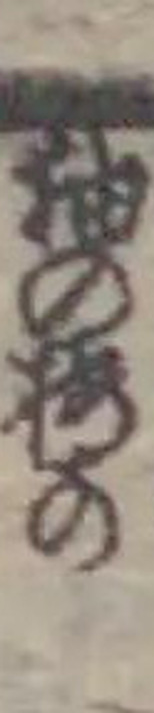袖の梅の
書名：藝者五人娘 2巻
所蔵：国立国会図書館 National Diet Library, JAPAN
